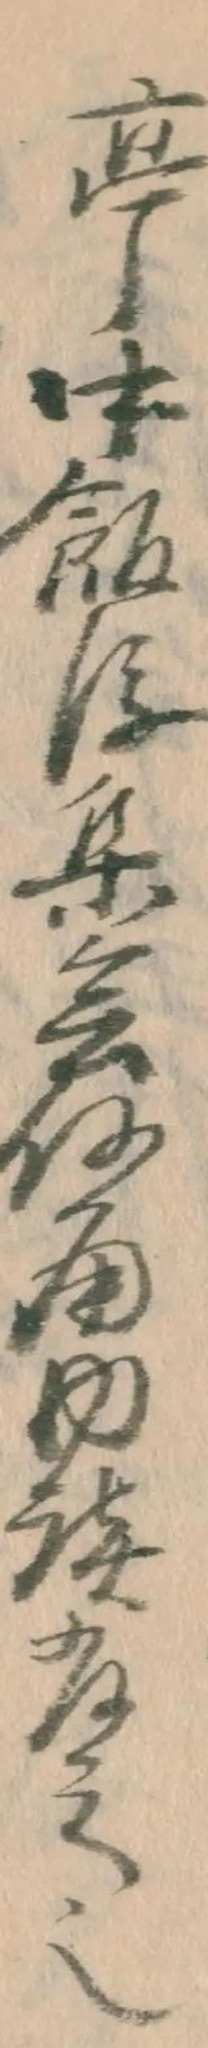亭中飯後集会何角内談有之也
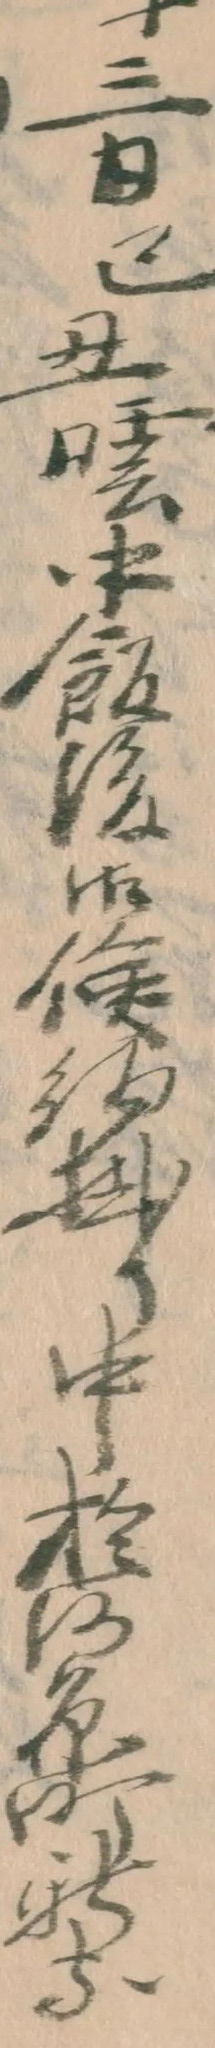十三日己丑曇中飯後御倹約掛り中於河原町新家
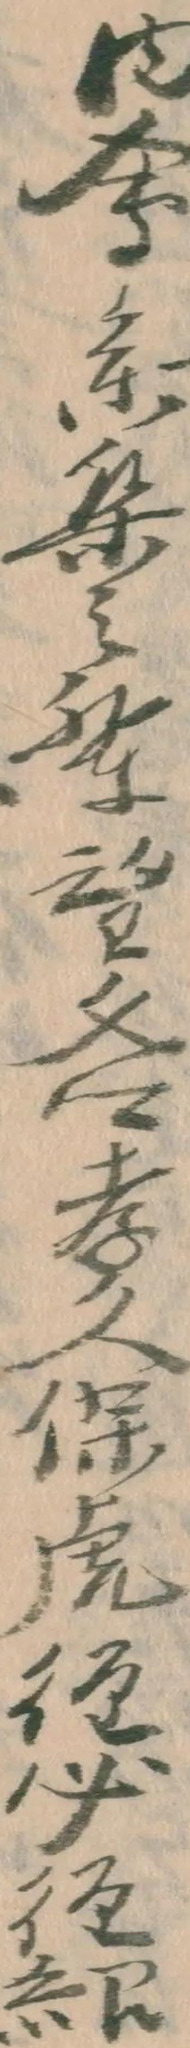内會参集之輩望久卿孝久保虎経必経紹
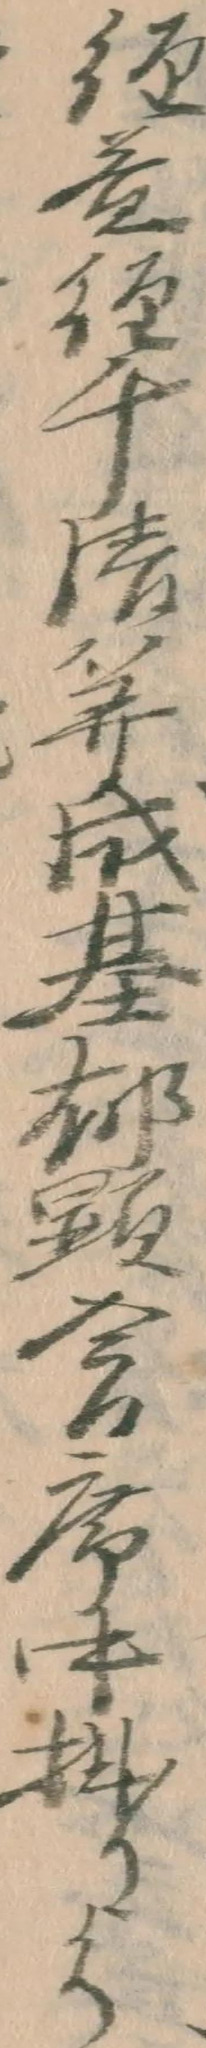経益経千清算成基郁顕今日席中掛りより
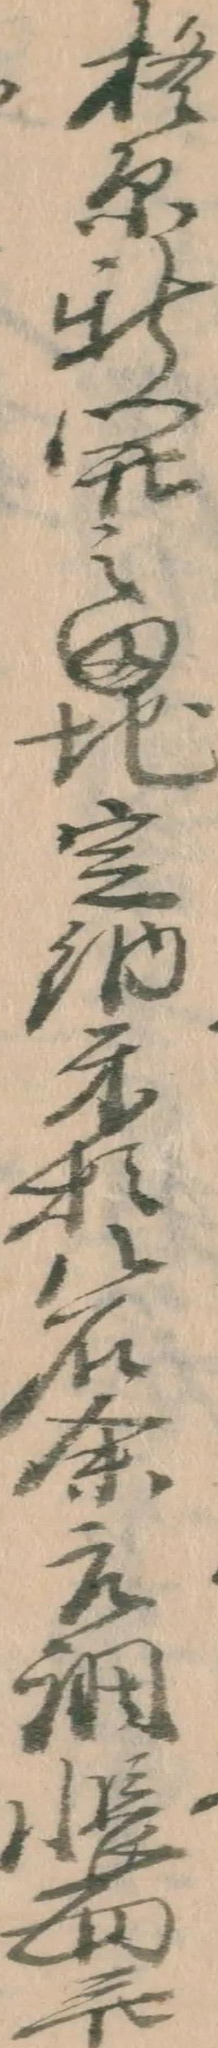柊原新開之田地定納米拾八石余取調帳面并
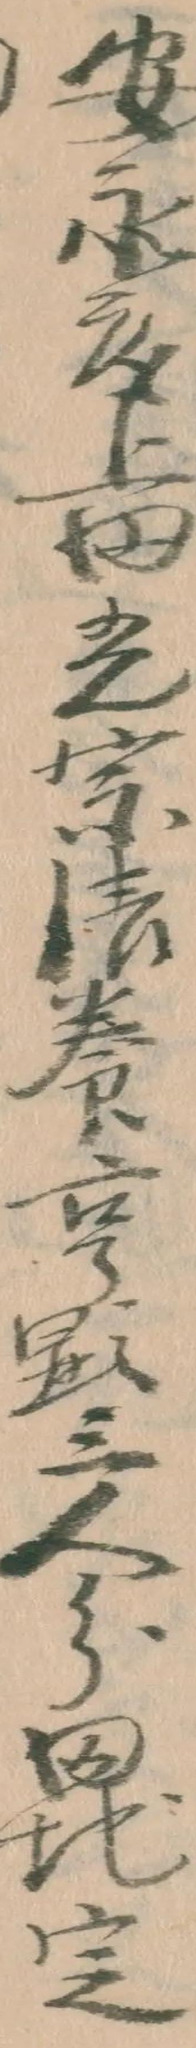安永度上田光宗清養亨顕三人分田地定
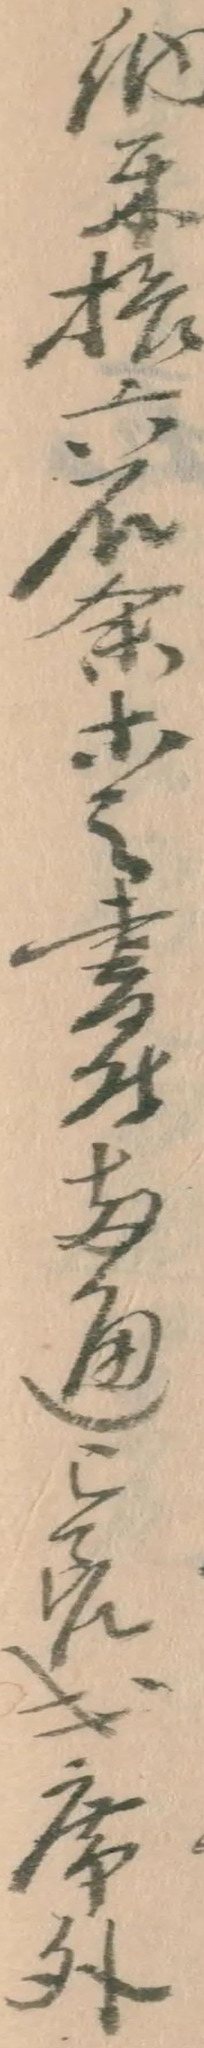納米拾六石余等之書付両通被差出席外
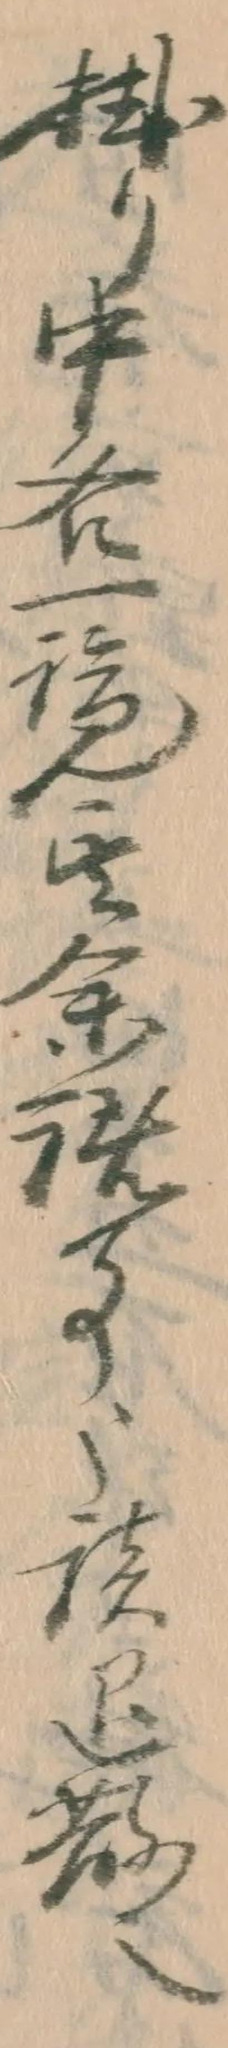掛り中各一覧其余諸事申談退散也
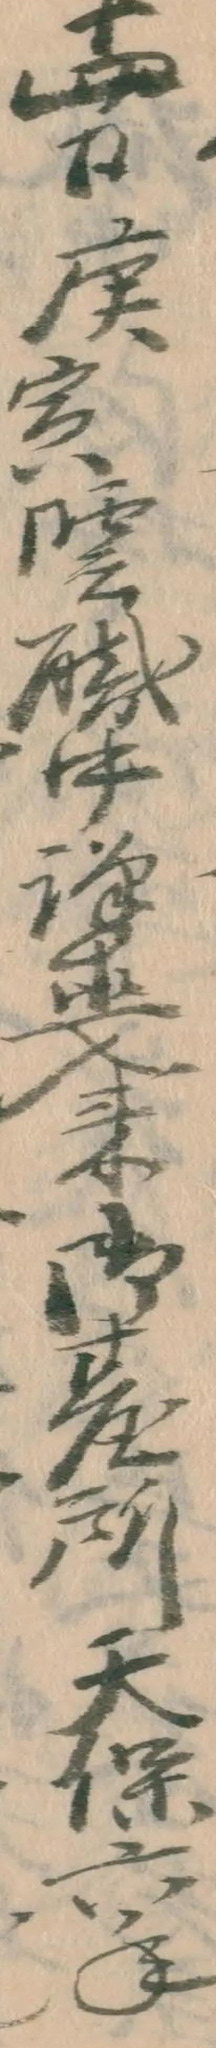十四日庚寅曇職中謹直入来御臺所天保六年
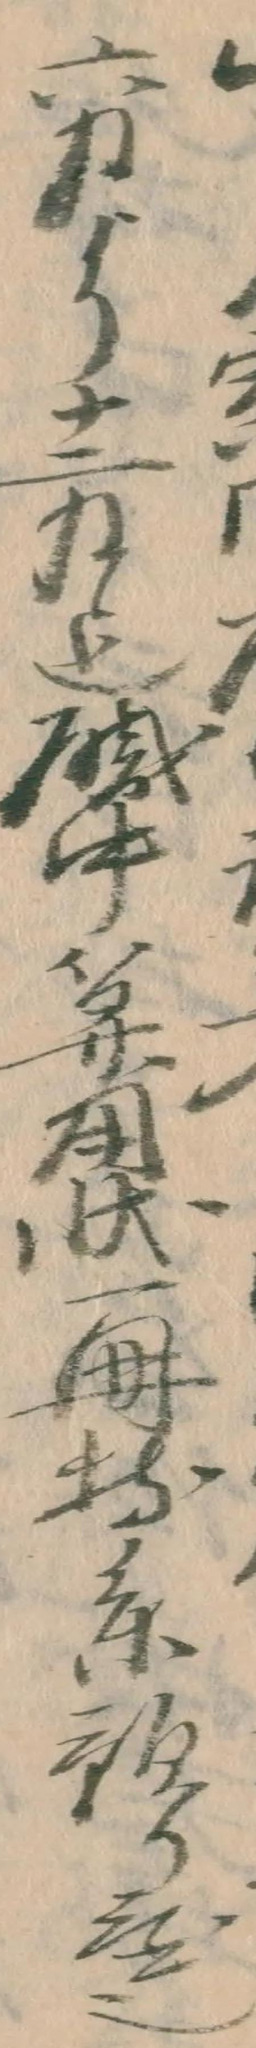六月より十二月迄職中算用状一冊持参預り置也
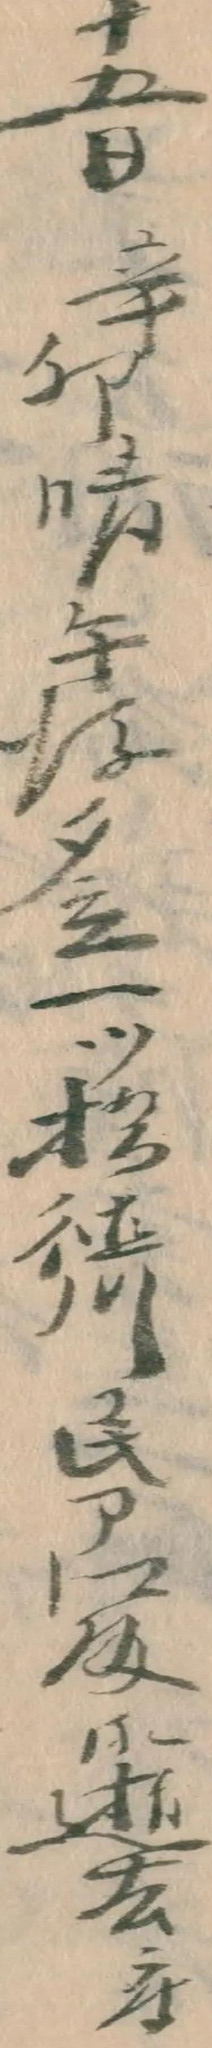十五日辛卯晴午後夕立一ツ橋徳川民部卿殿御逝去ニ付
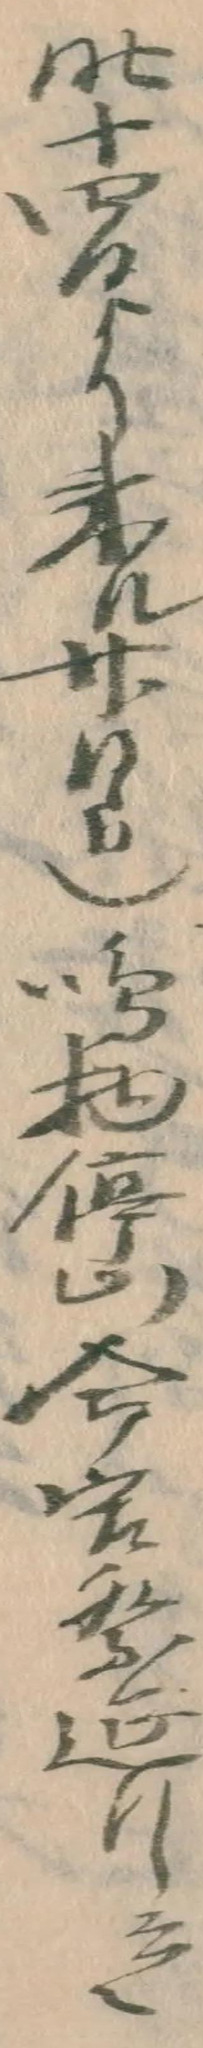昨十四日より来ル廿日迄鳴物停止今宮祭延引云々
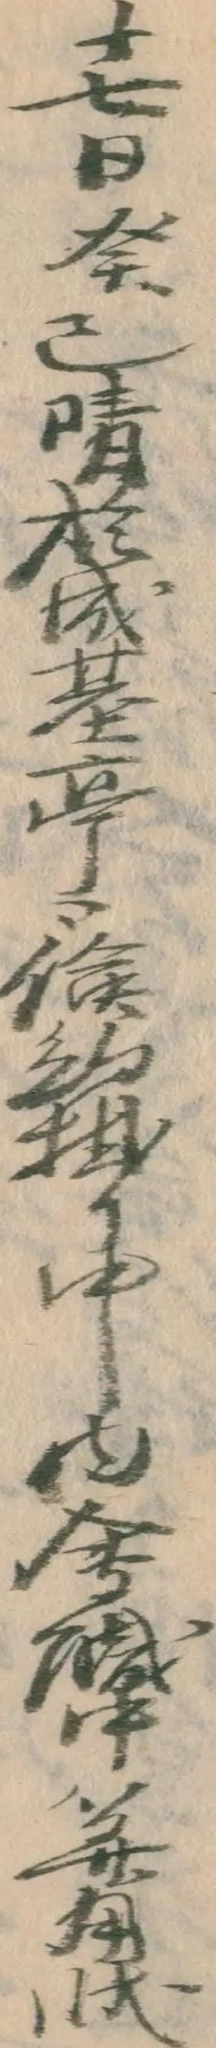十七日癸巳晴於成基亭御倹約掛り中之内會職中算用状
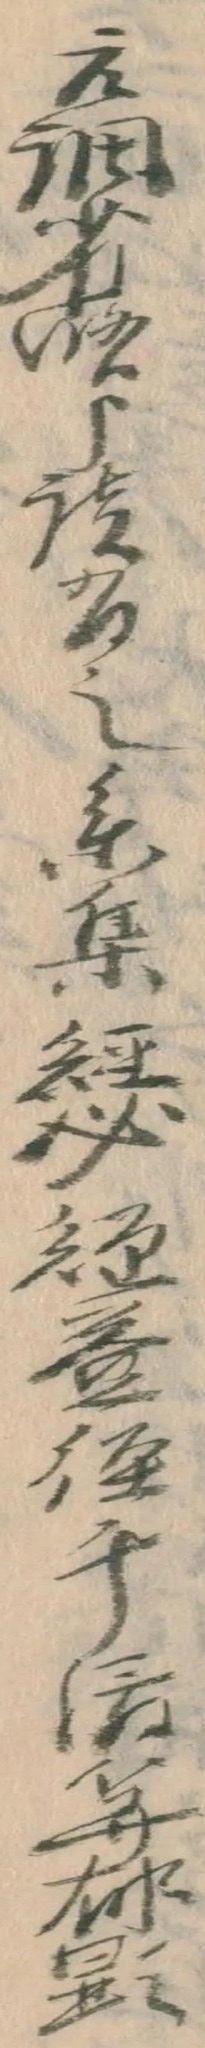取調省略申談有之参集経必経益経千清算郁顕
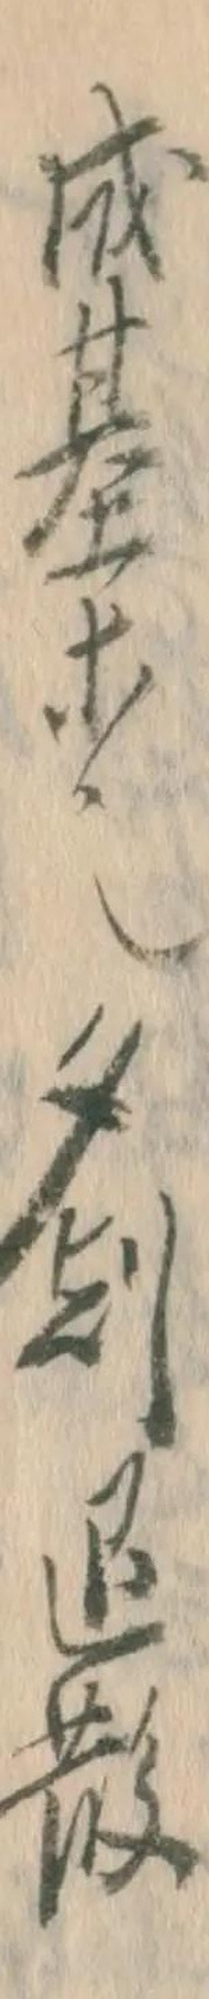成基等也夕刻退散
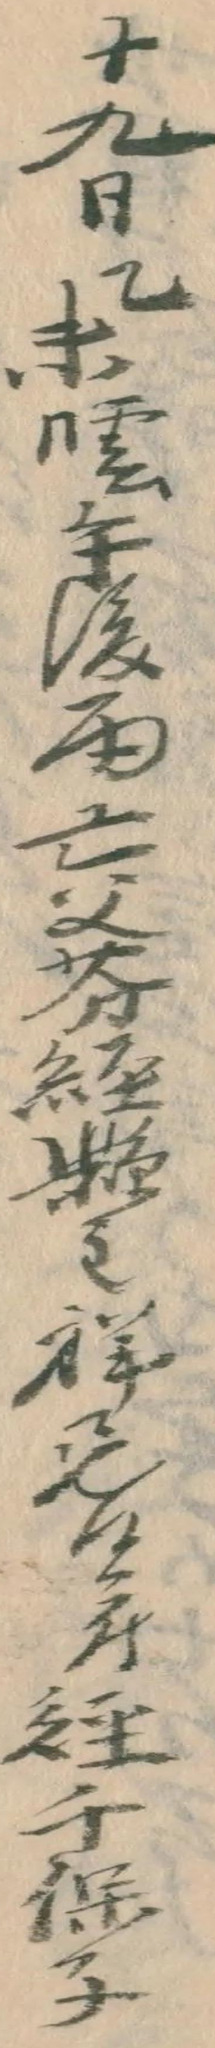十九日乙未曇午後雨亡父芬経縣主祥忌日ニ付経千保子
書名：賀茂社記録. 第67冊
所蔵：国立国会図書館 National Diet Library, JAPAN
